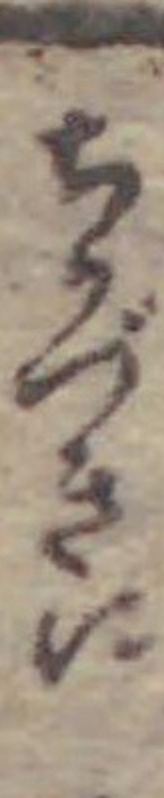ちかづきに
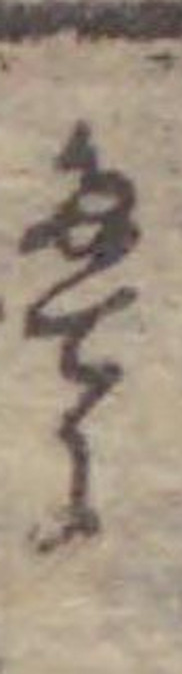たてに
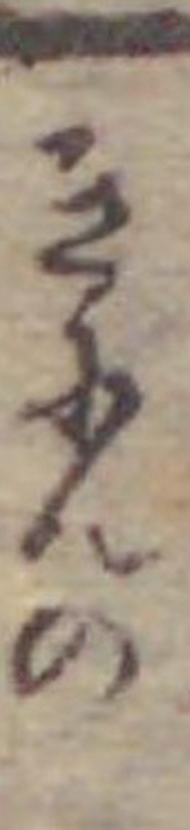きにんの
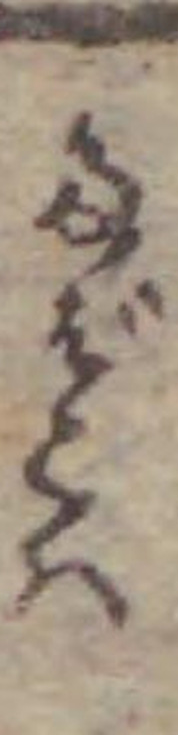たばこは
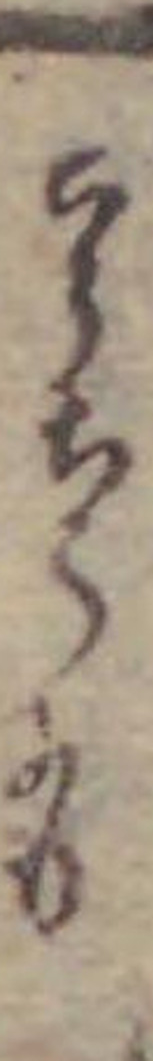こうちうにも
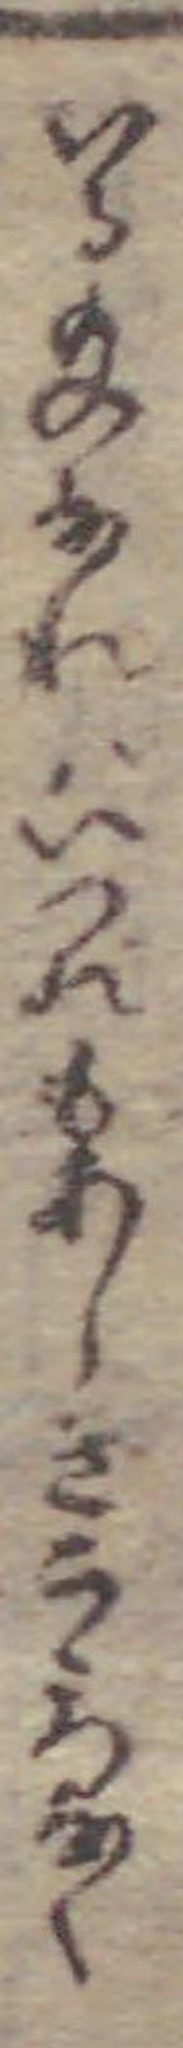いるものなれはいつれもあしきこゝろなく
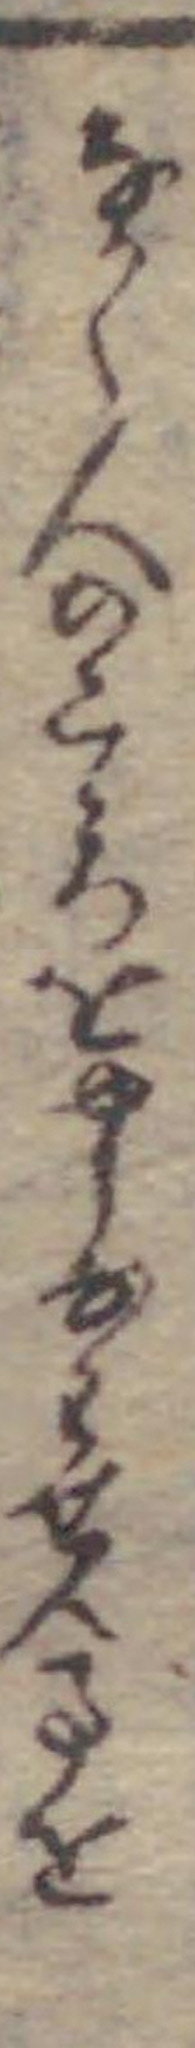なかく人のこゝろをやしなわせん事を
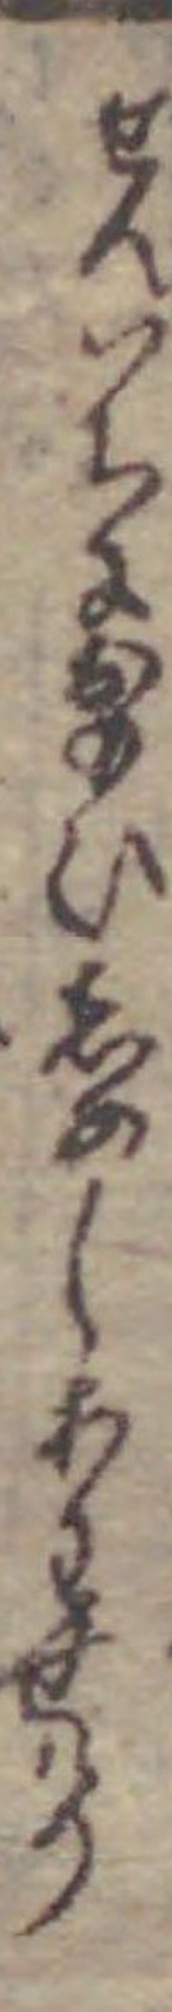せんいちにおもひしめしあわせけり
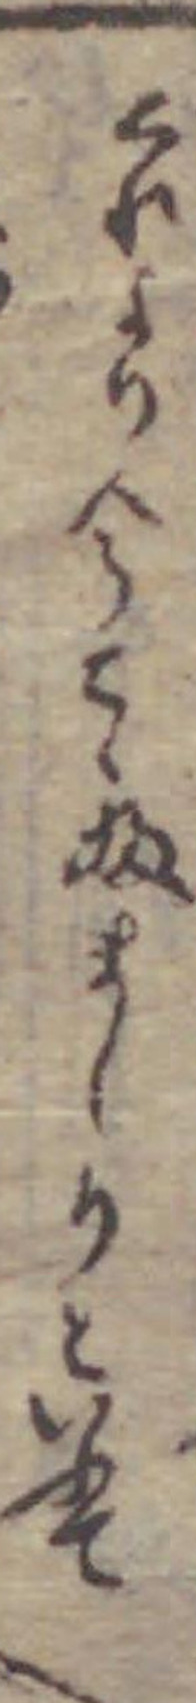くれより今こゝふましりといふて
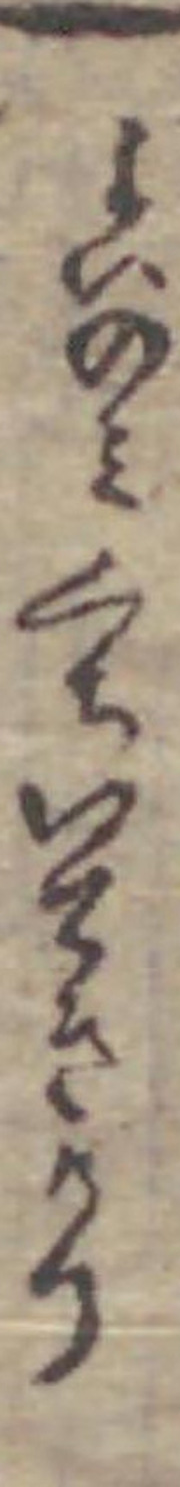よいのみくちいてきけり

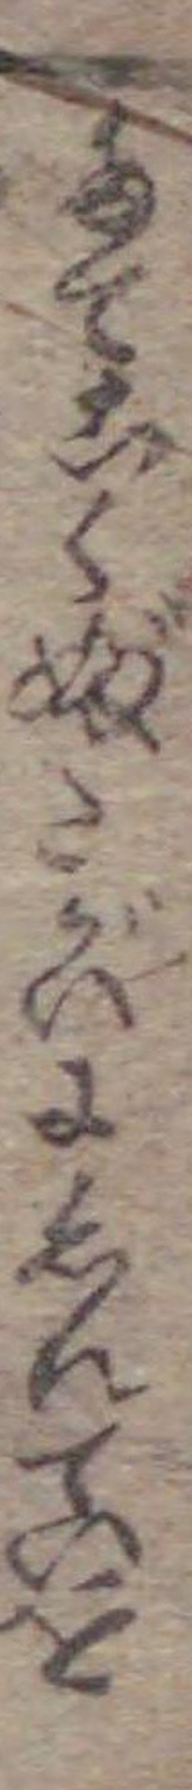たてこくぶたがいにしんていを
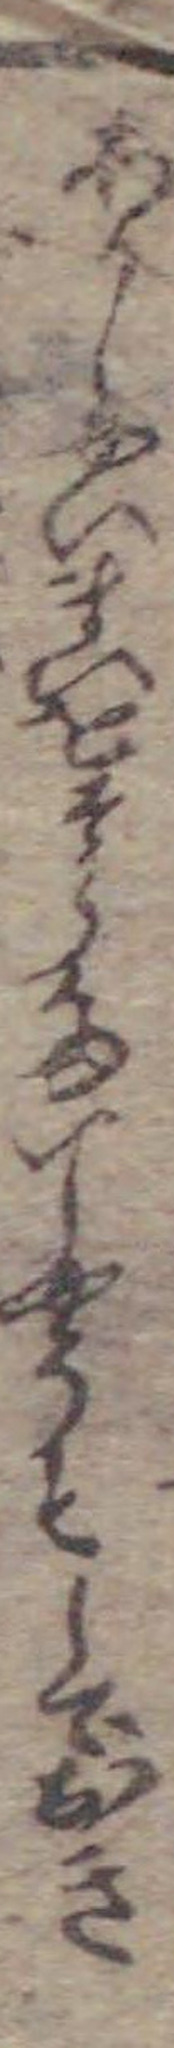あかしやいまいをそうたいしやうもしておき
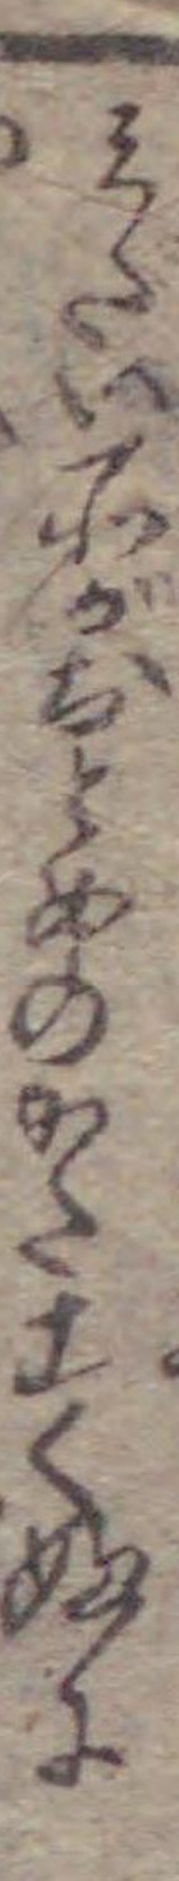みだい所がおとめのかたちくふに
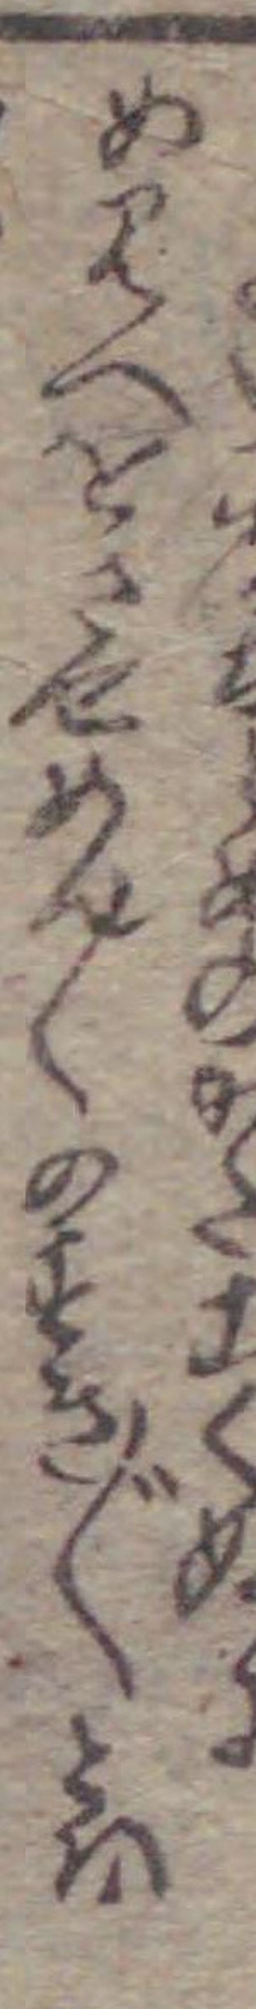め見へをさせめん〳〵のすき〴〵とは
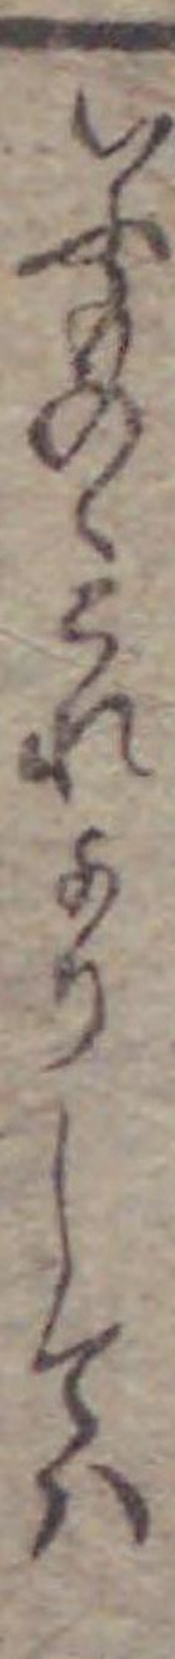いふものゝこれよりしては
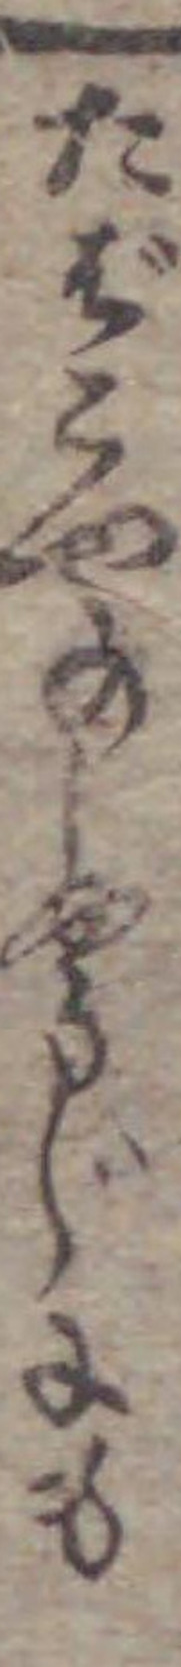たばこやのしやるじにも
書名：談芭菰誉詞 : 3巻
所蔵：国立国会図書館 National Diet Library, JAPAN
